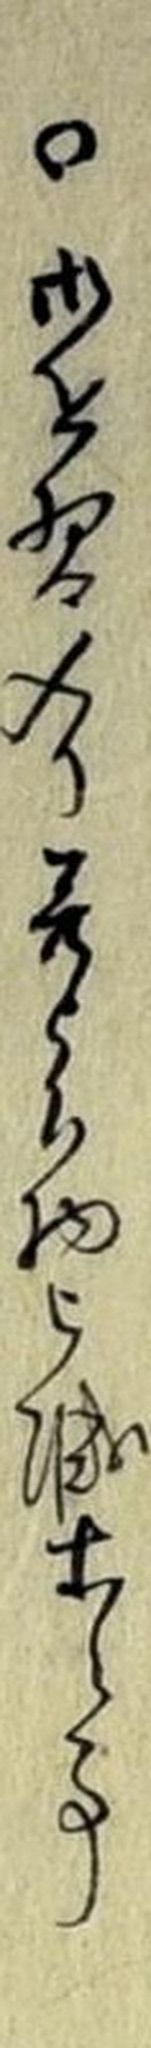〇御近習〆り并被下物被減等之事
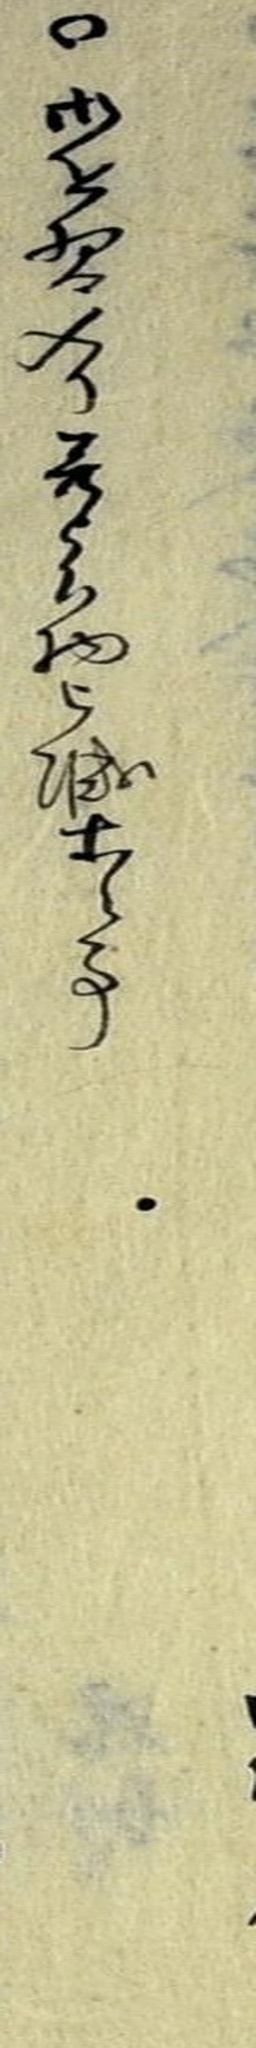〇御近習〆り并被下物被減等之事
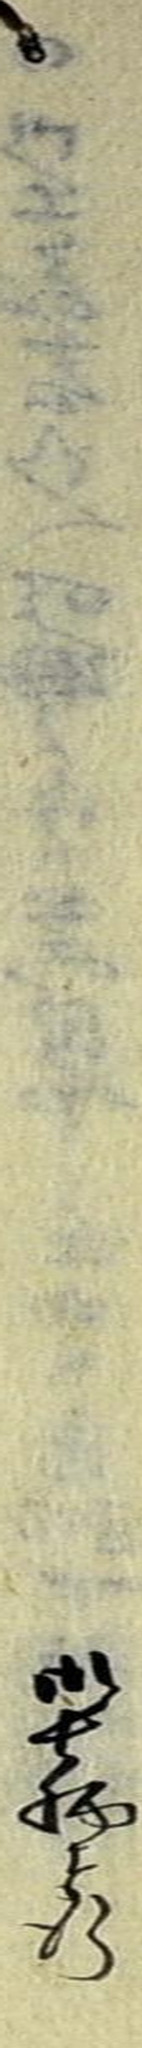御長柄奉行
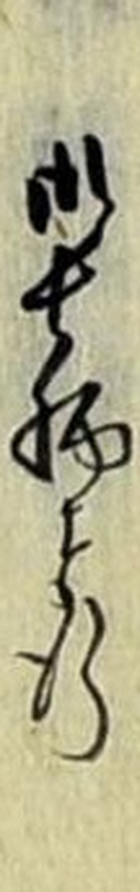御長柄奉行
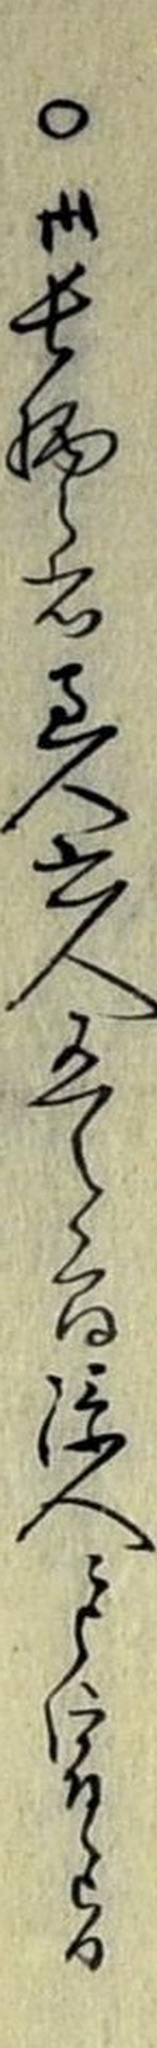〇御長柄之者過人六人有之候間浮人に被仰付候旨
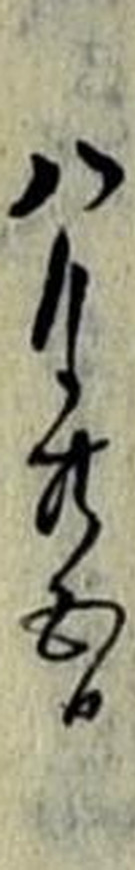八月廿五日
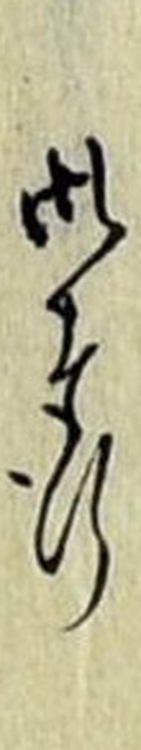御奉行
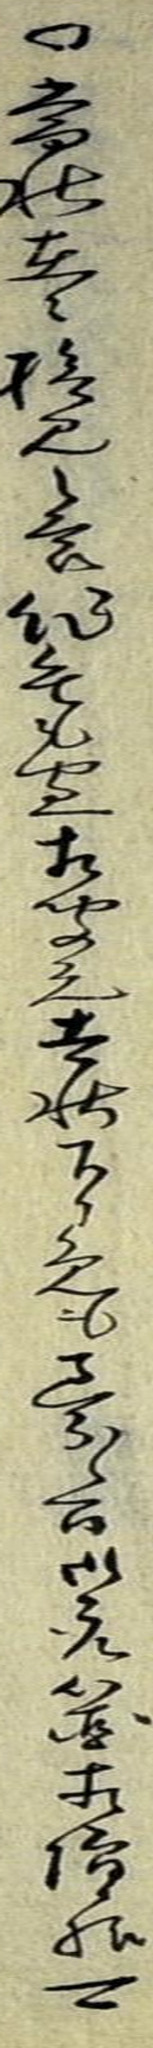〇当秋在々検見之節作毛も宜相聞元去秋下り免も過分候間御取箇相増候様可
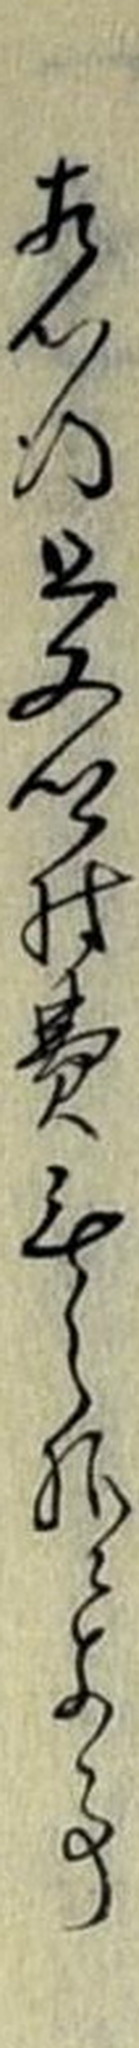相心得且又郷村費無之様にとの事
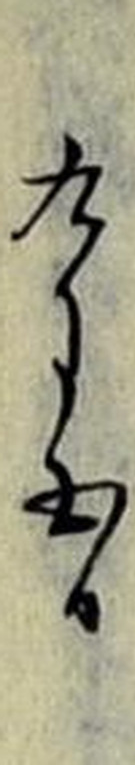九月五日
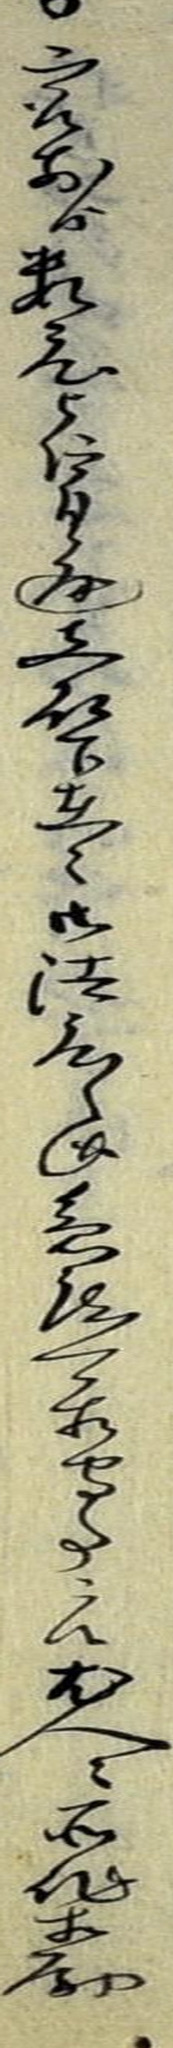〇最前ゟ数度被仰付候通支配下在々御法度之趣急度可相守事に候尤人に所作相励
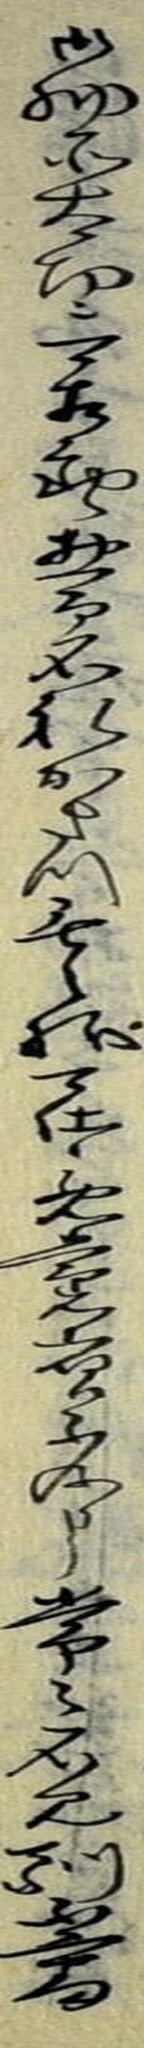御納所太切に可相勤候惣而不礼かさつ無之様可仕候悪党者は不及申常々不見馴不審
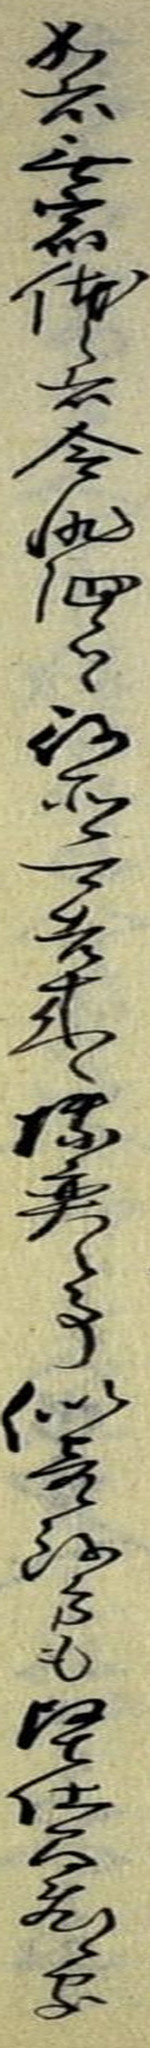成者無宿体之者令徘徊候はゝ役所へ可告来候博奕之事似寄致方も堅仕間敷候処
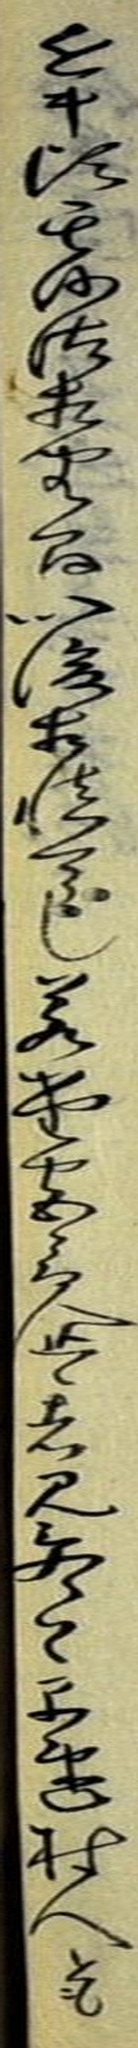近き頃其沙汰相聞候間以後相慎可申候若堂宮に而企候者見受候はゝ早速村人とも
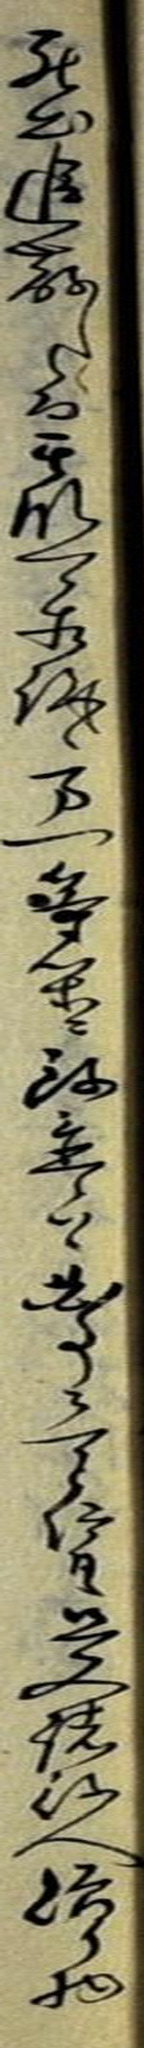罷出追散し候而其段可相訴候万一等閑に致置候はゝ曲事に可被仰付候且又諸役人贈り物
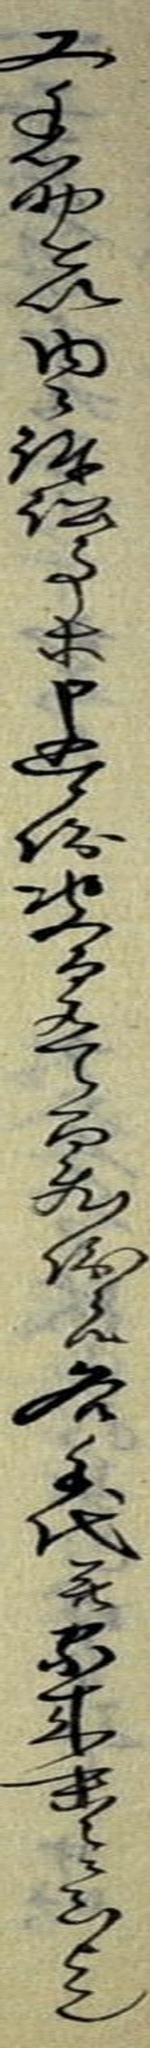又手筋を以内々訴訟事等申込候儀決而有之間敷儀に候各手代并家来末々に至迄
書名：命令之部 二
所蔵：福井県文書館 Fukui Prefectural Archives
